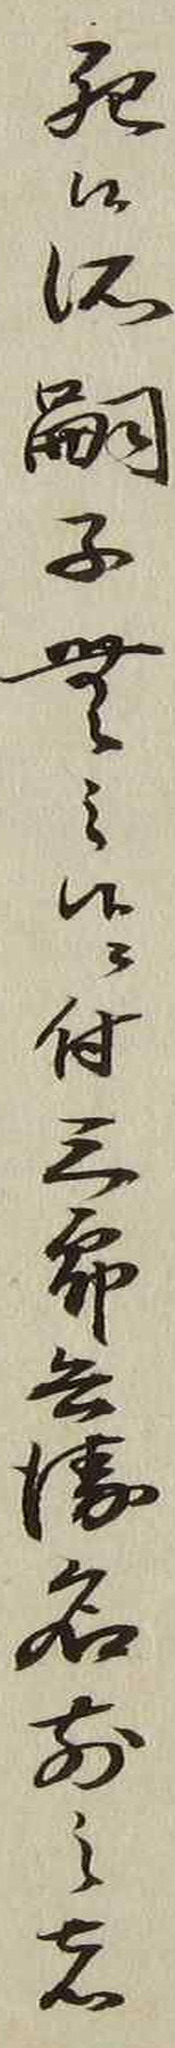死候所嗣子無之候に付三郎兵衛名前之者
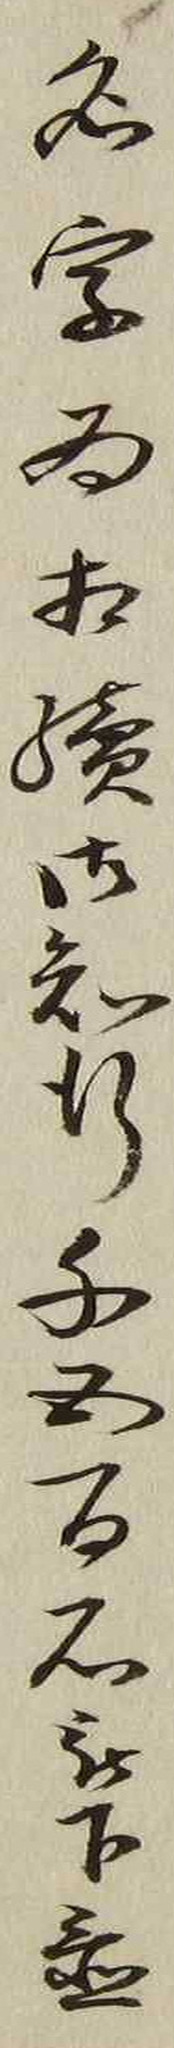名字為相続御知行千五百石被下置
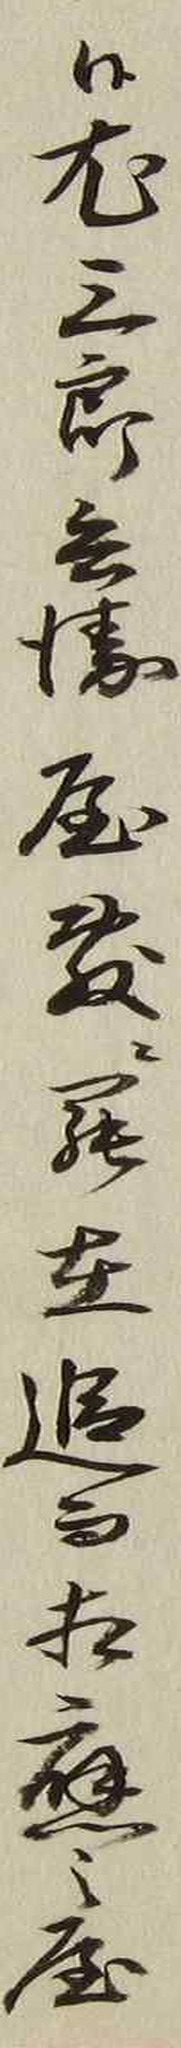候尤三郎兵衛屋敷に罷在追而相応之屋
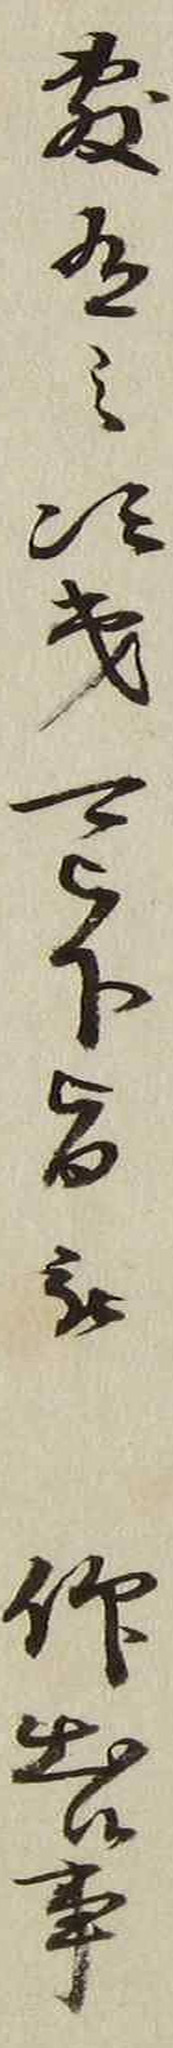敷有之次第可被下旨被仰出候事
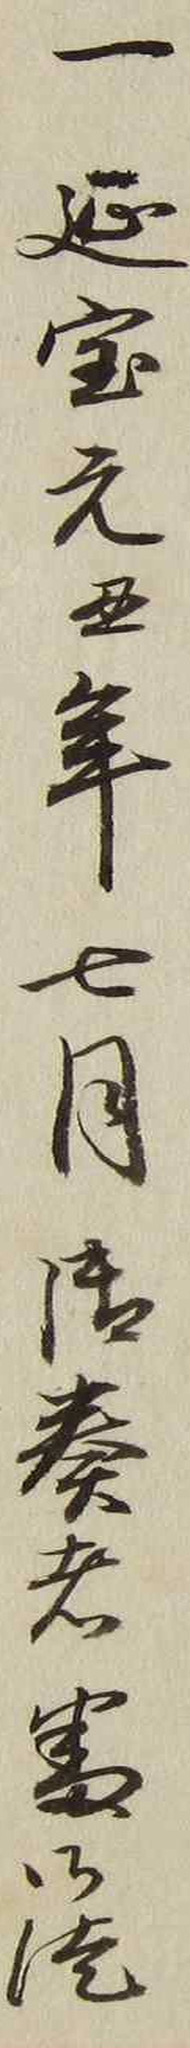一延宝元丑年七月御奏者番御徒
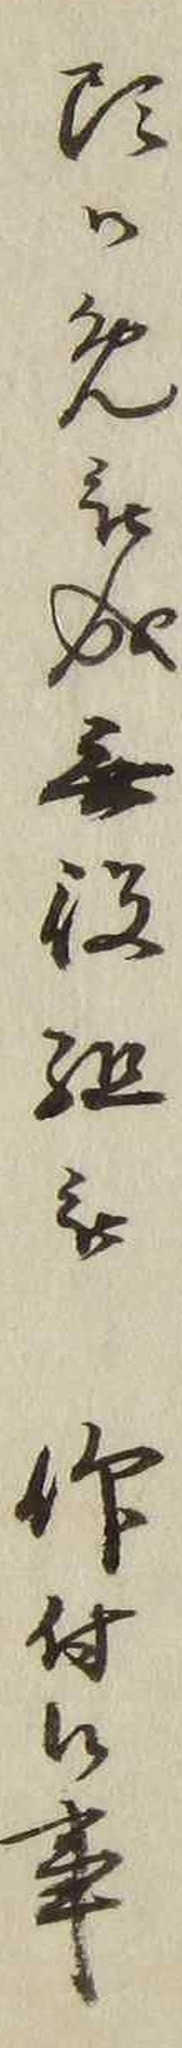頭御免被成無役組被仰付候事
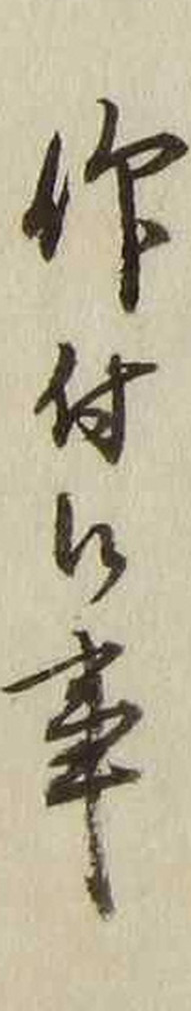仰付候事
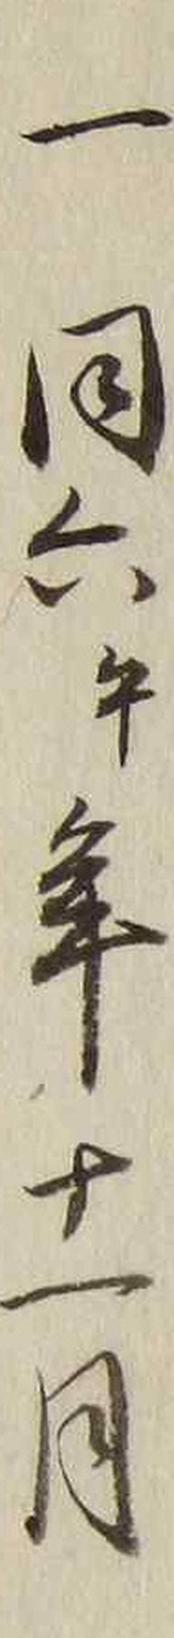一同六午年十一月

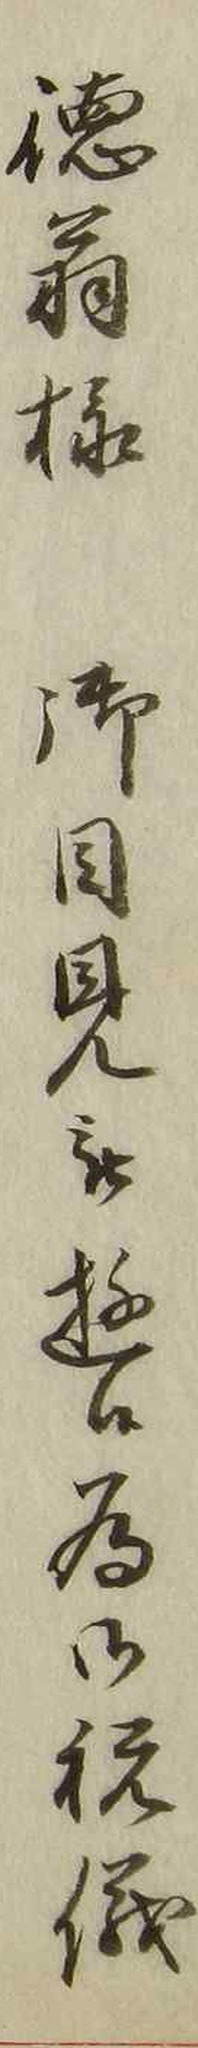徳翁様御目見被遊候為御祝儀
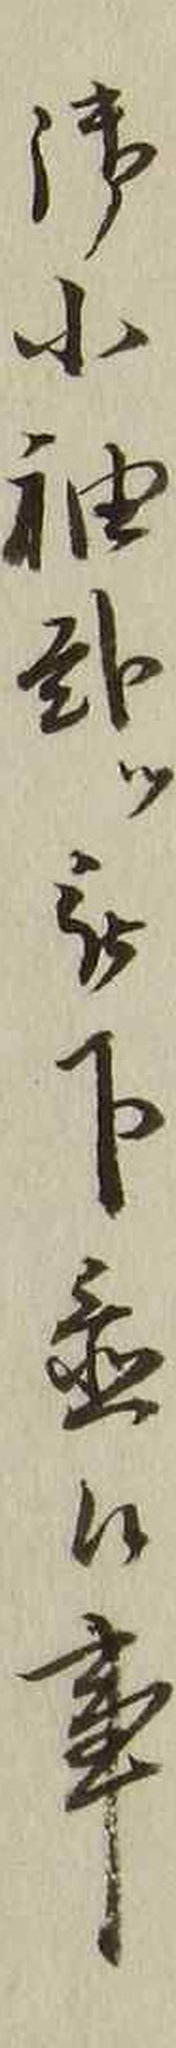御小袖弐つ被下置候事
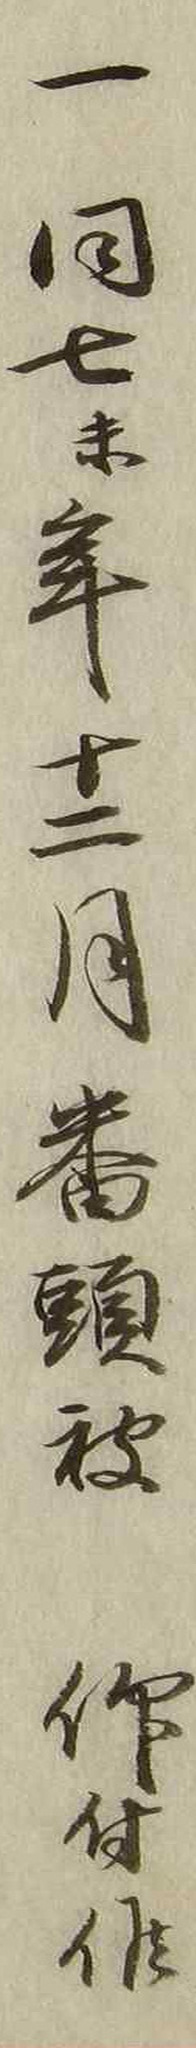一同七未年十二月番頭被仰付候
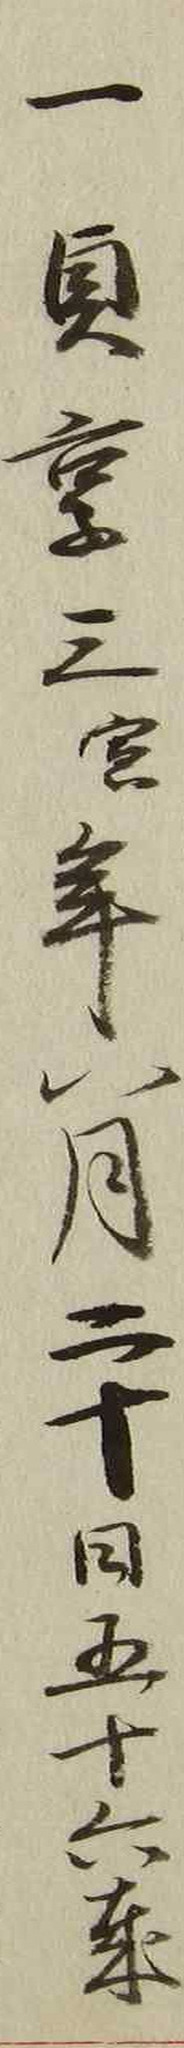一貞享三寅年八月二十日五十六歳
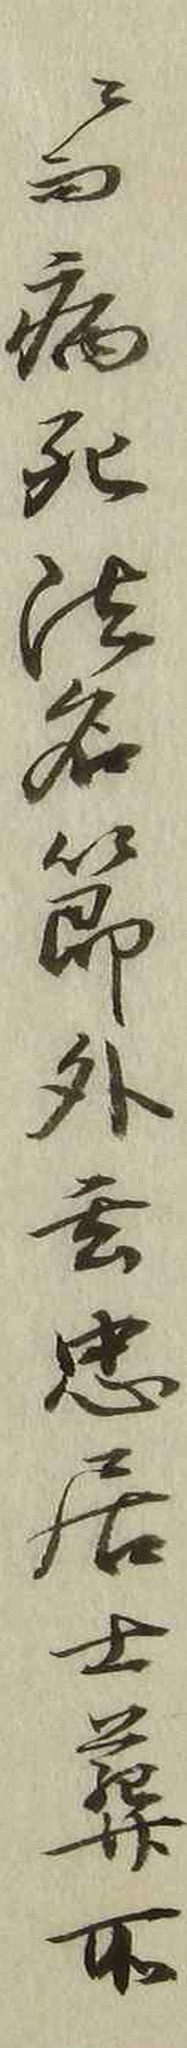に而病死法名節外玄忠居士葬所
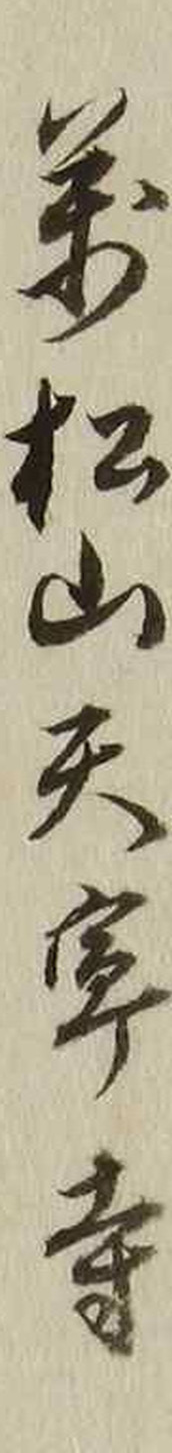萬松山天寧寺
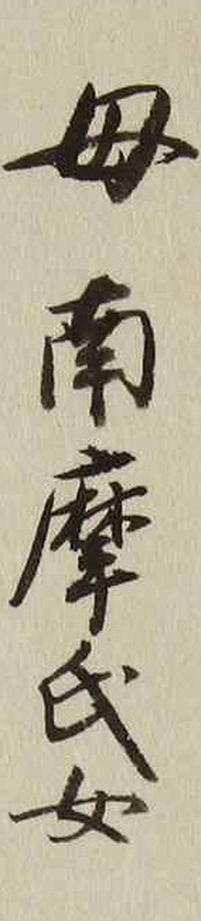母南摩氏女
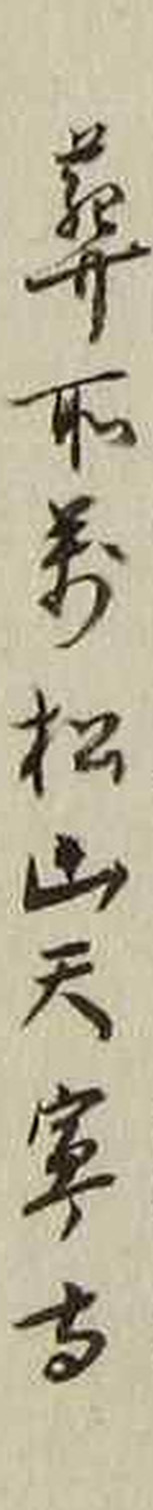葬所萬松山天寧寺
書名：諸士系譜　巻之125　た之部1
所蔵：会津若松市立会津図書館
